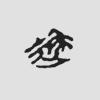{辶尾}
